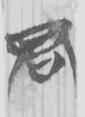君
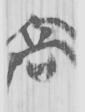高
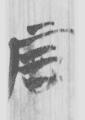石
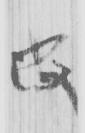奴
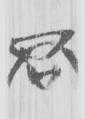君
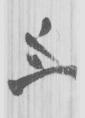之
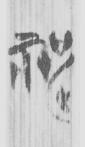神
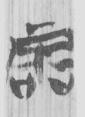霝
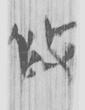攸
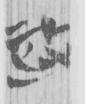政
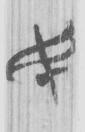民
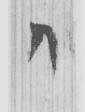人
